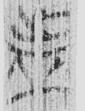者
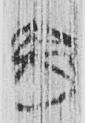因
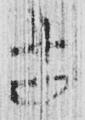古
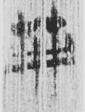○（冊）
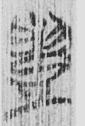豊（禮）
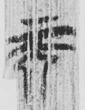而
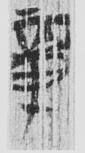章
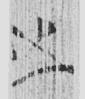之
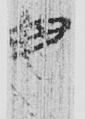母
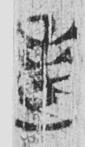逆
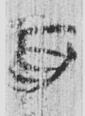百
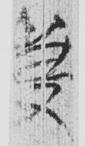事
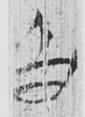皆
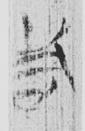青（請）
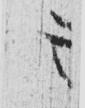行
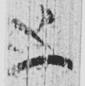之
